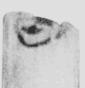古（故）
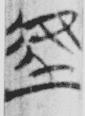○（吾）
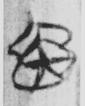{囗矢}（因）
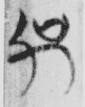加（譴）
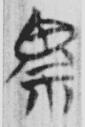{示鬼}（鬼）
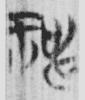神
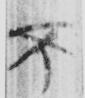不
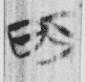明
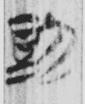則
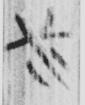必
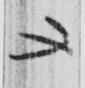又
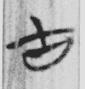古（故）
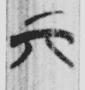亓
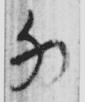力
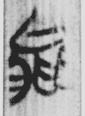能
